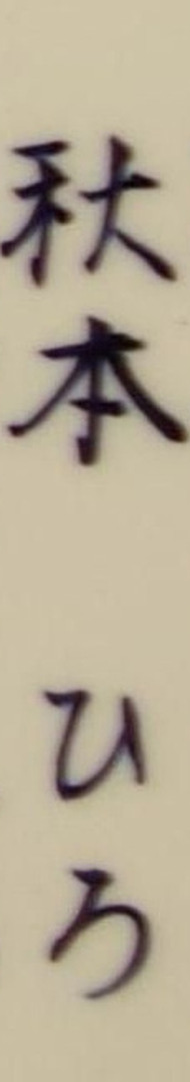秋本ひろ
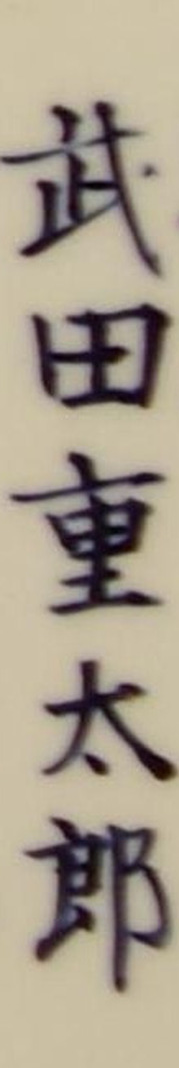武田重太郎
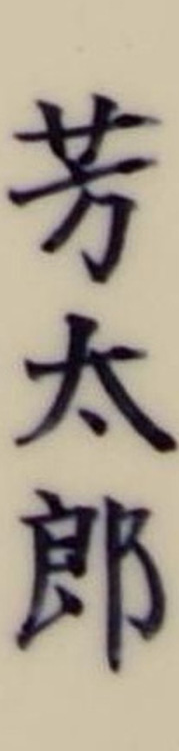芳太郎
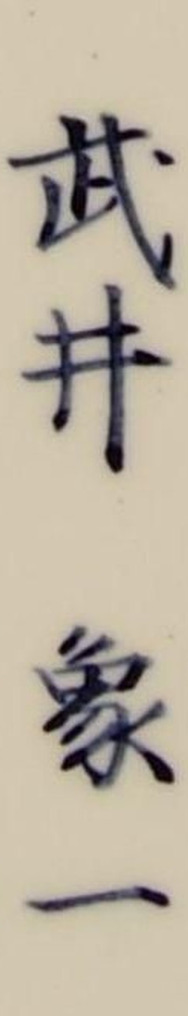武井象一
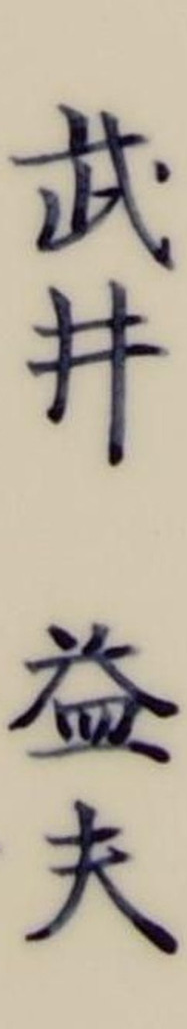武井益夫
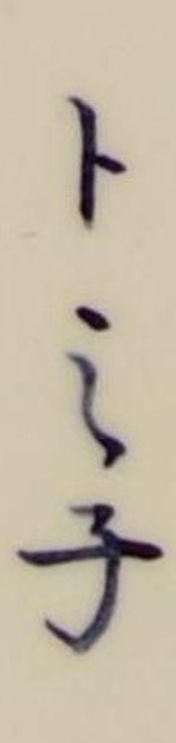トミ子

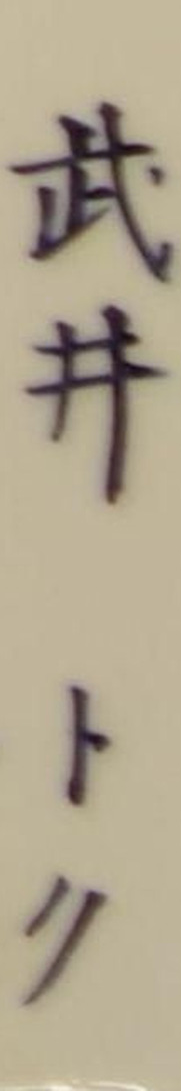武井トク
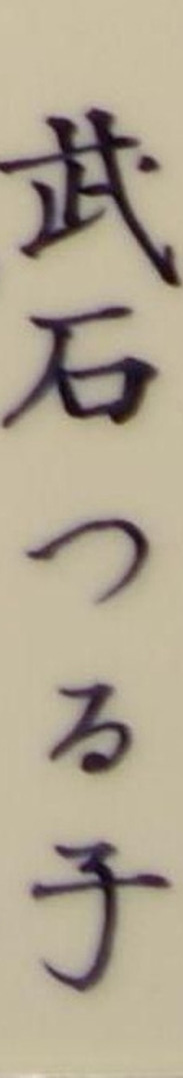武石つる子
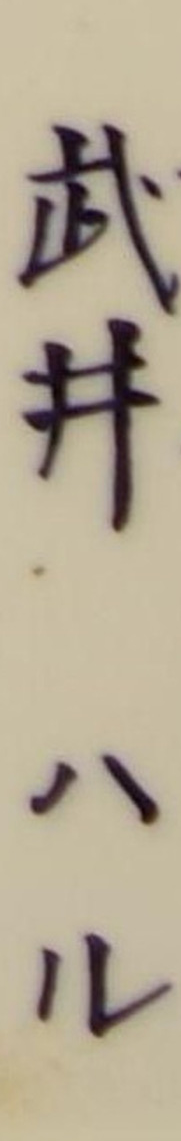武井ハル
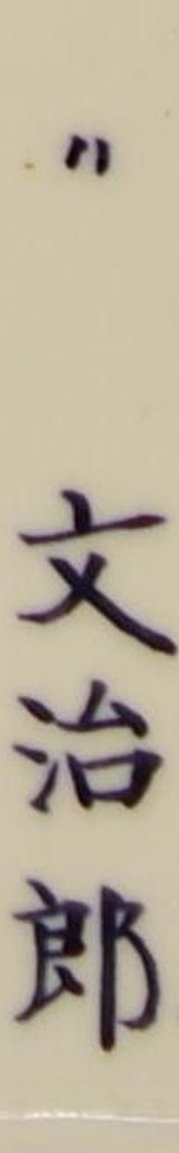文治郎
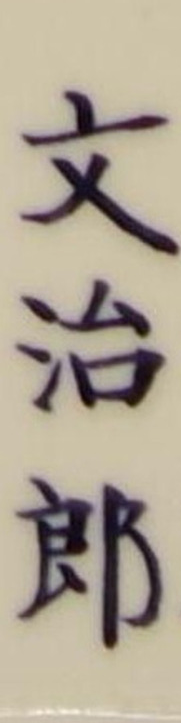文治郎
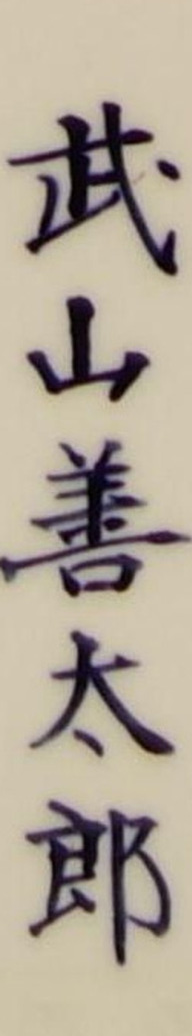武山善太郎
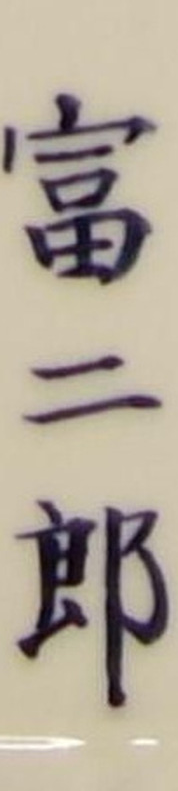冨二郎
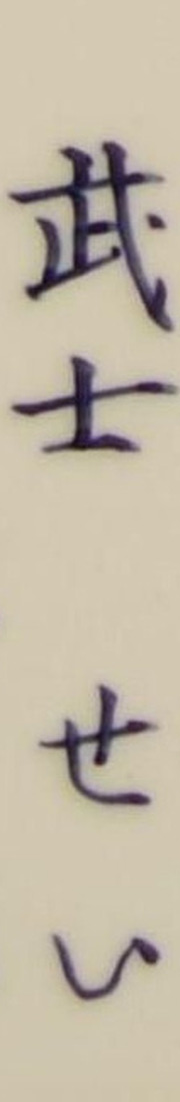武士せい
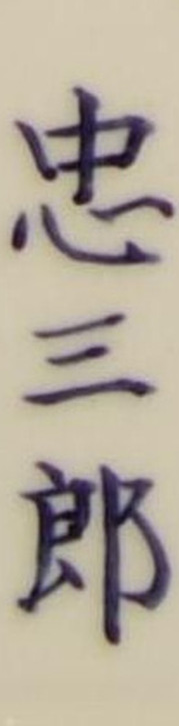忠三郎
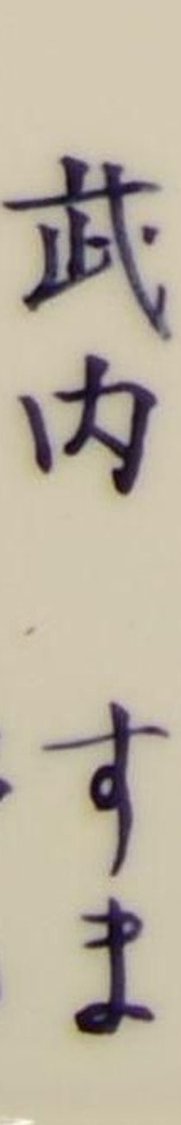武内すま
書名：A~D
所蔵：koyasan kongobuji
